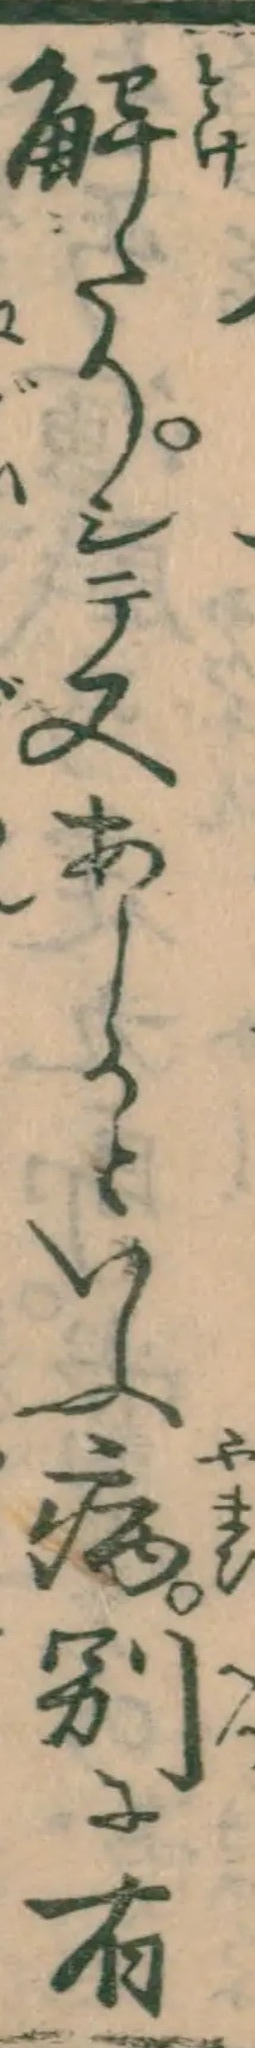解たり。シテ又あしかといふ病。別に有
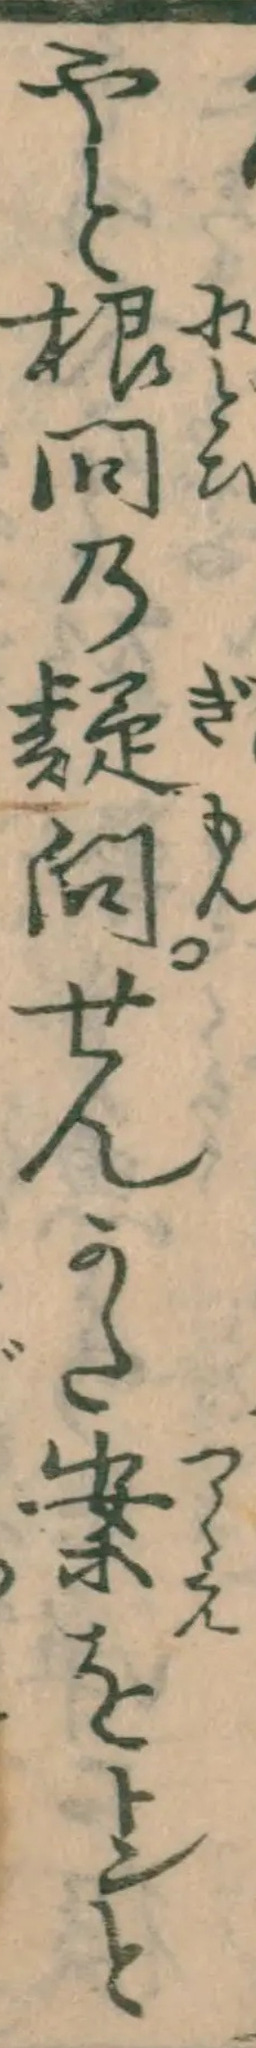やと根問の疑問。せんかた案をトンと
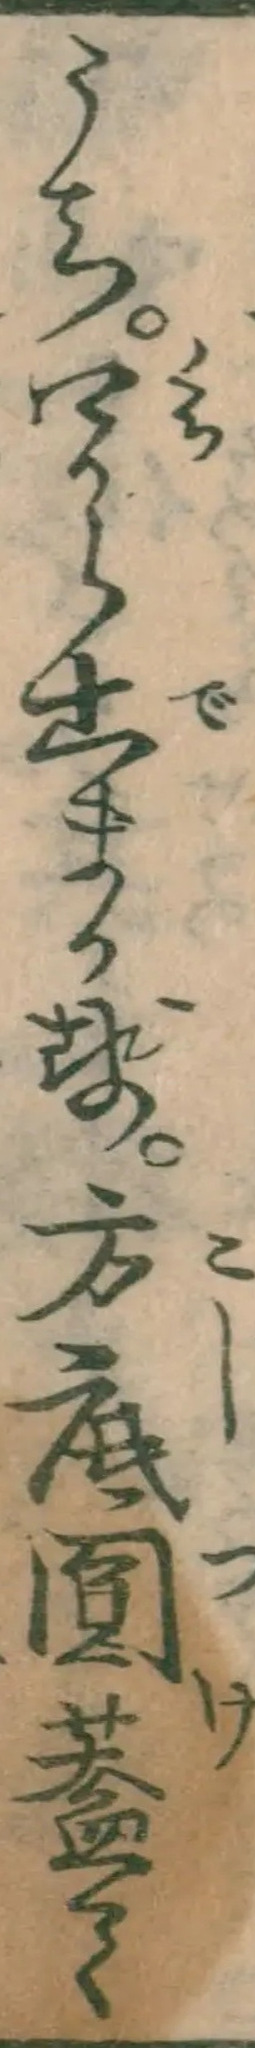うち。口から出まかせ。方底円蓋て
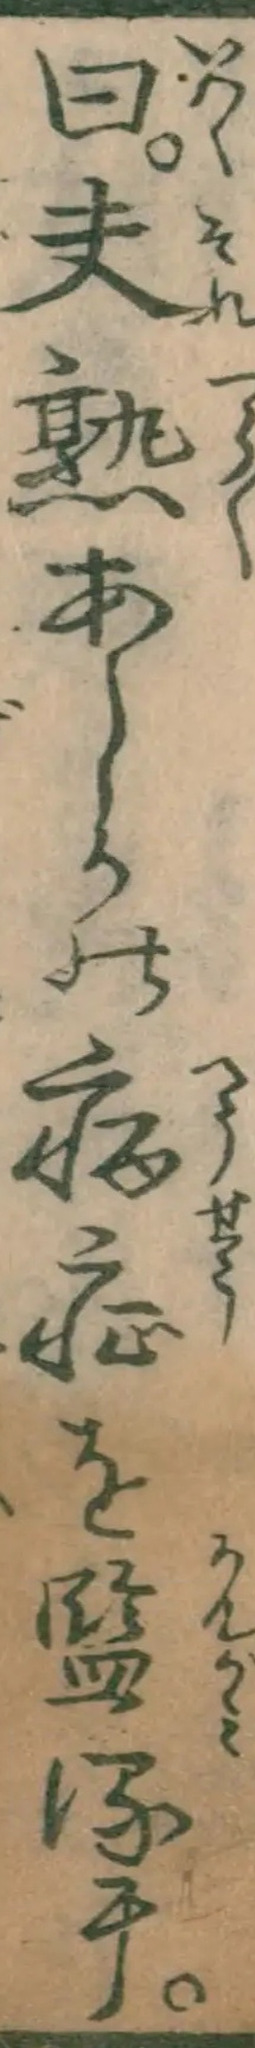曰。夫熟あしかの病症を監るに
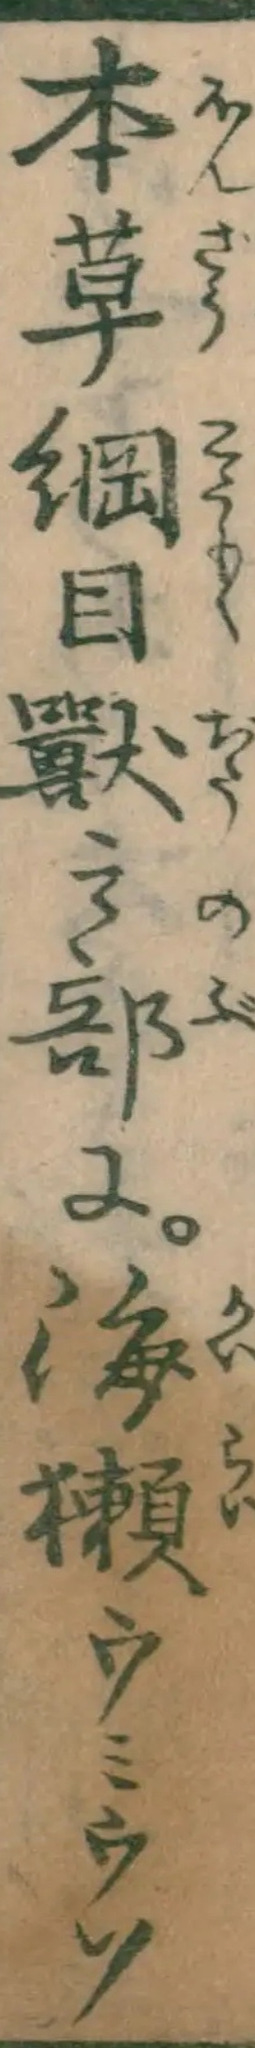本草綱目獣之部に。海獺ウミウソ

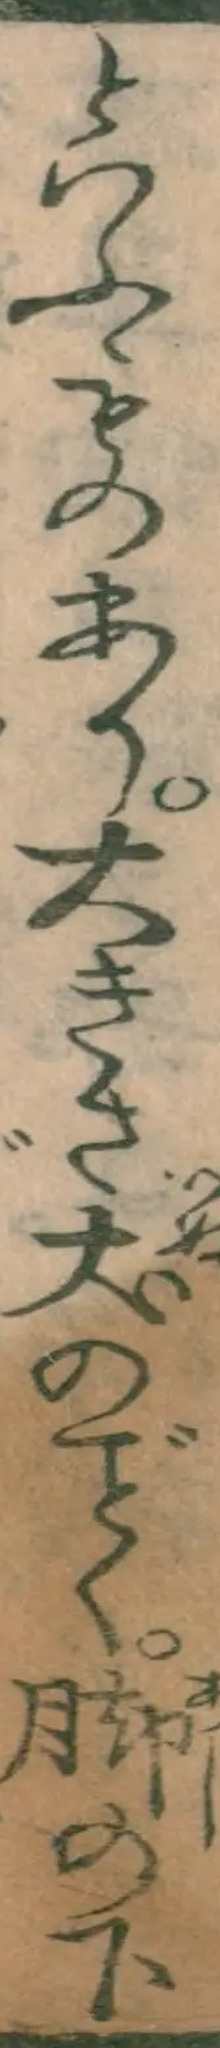といふものあり。大きさ狗のごとく。脚の下
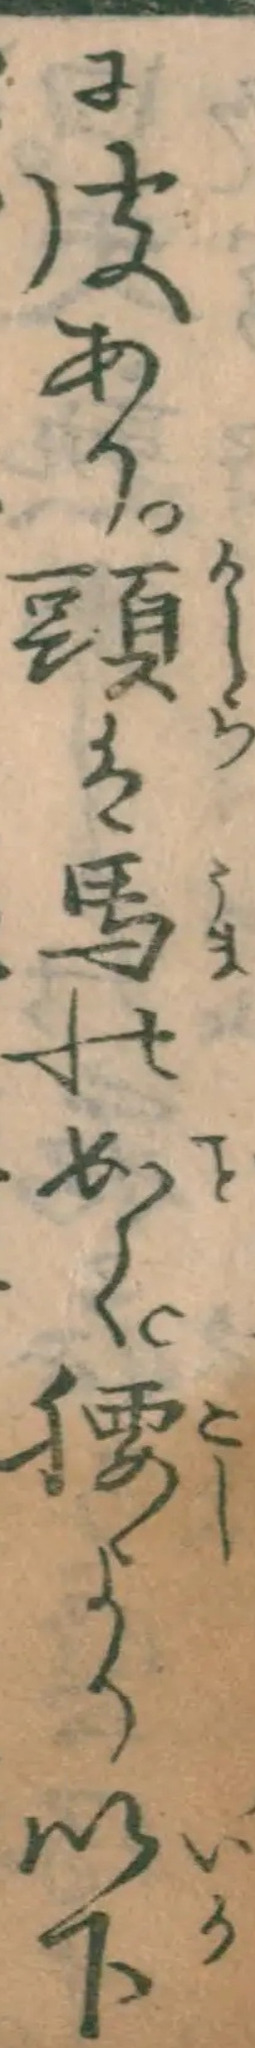に皮あり。頭は馬の如く。腰より以下
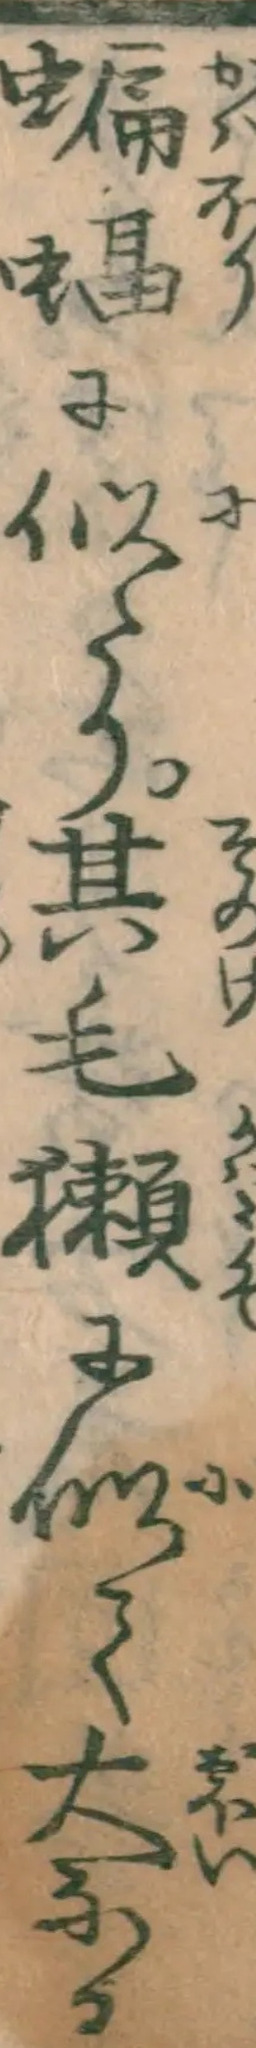蝙蝠に似たり。其毛獺に似て大なる
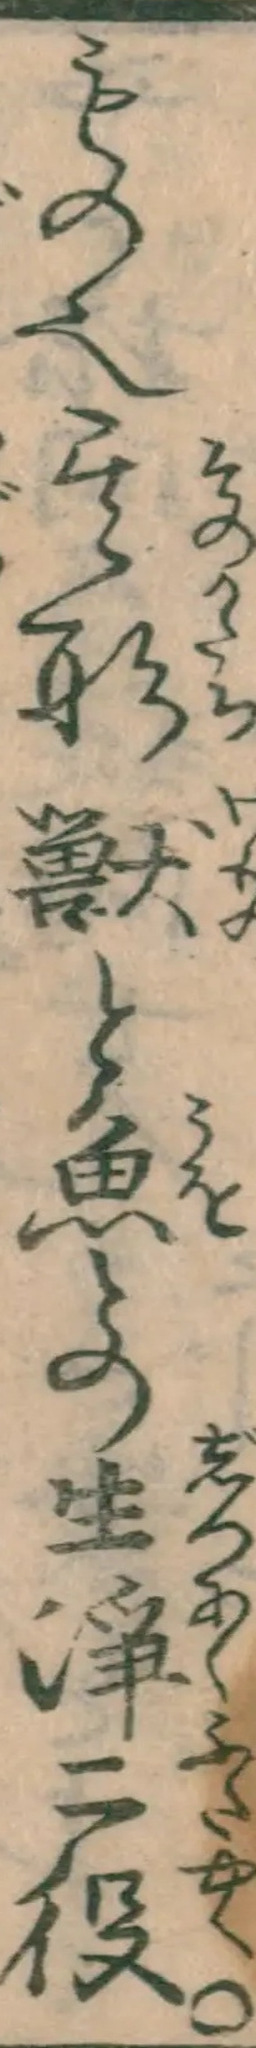もの也其形獣と魚との生浄二役。
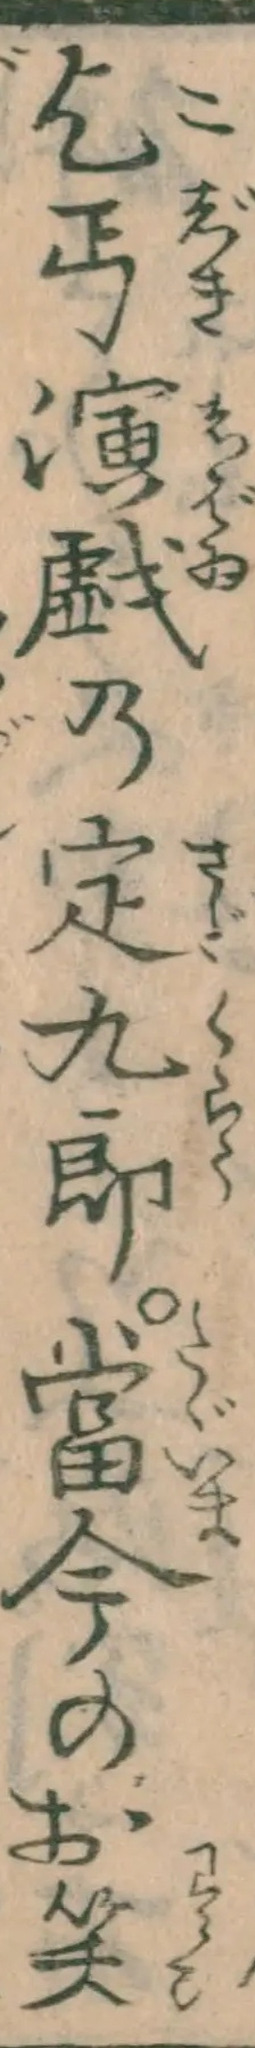乞丐演戯の定九郎。当今のお笑
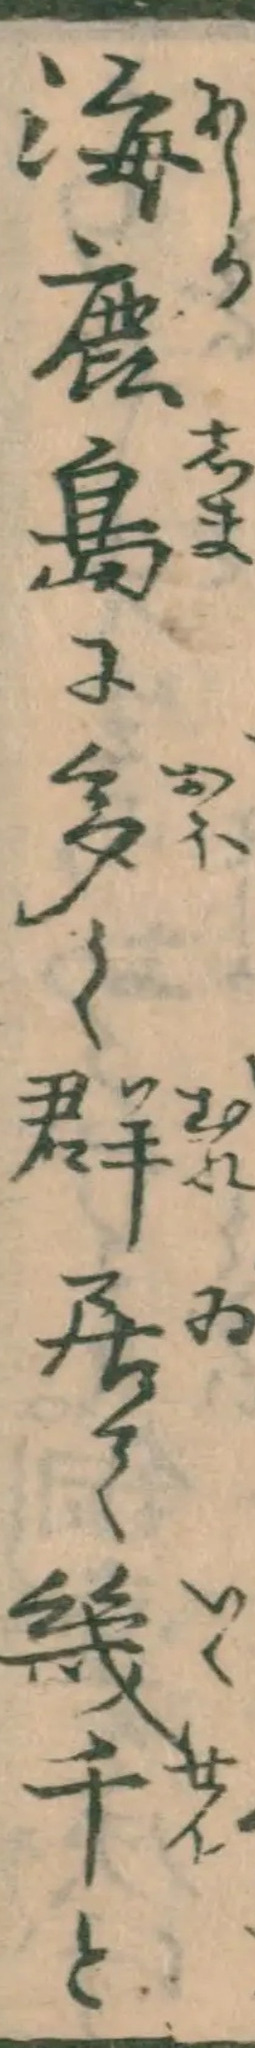海鹿島に多く群居て幾千と
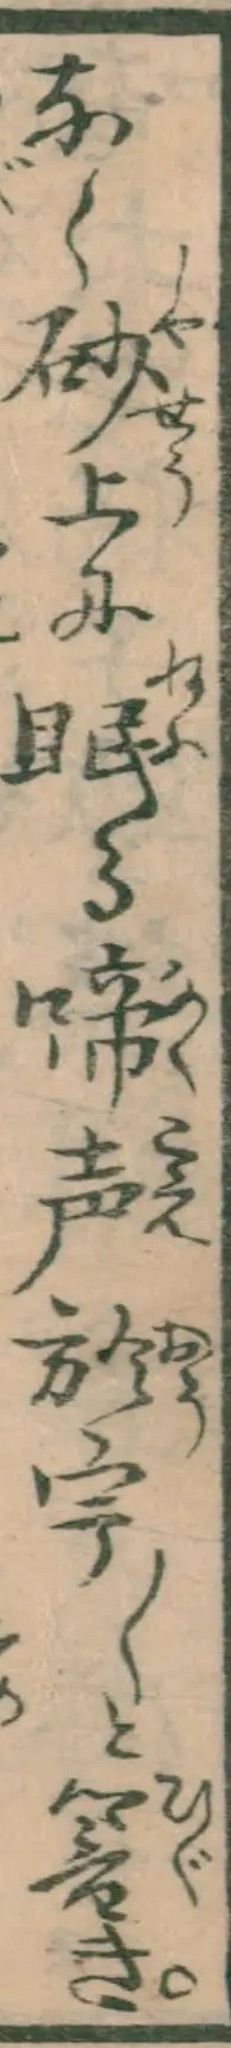なく砂上に眠る啼声於宇〳〵と響き。
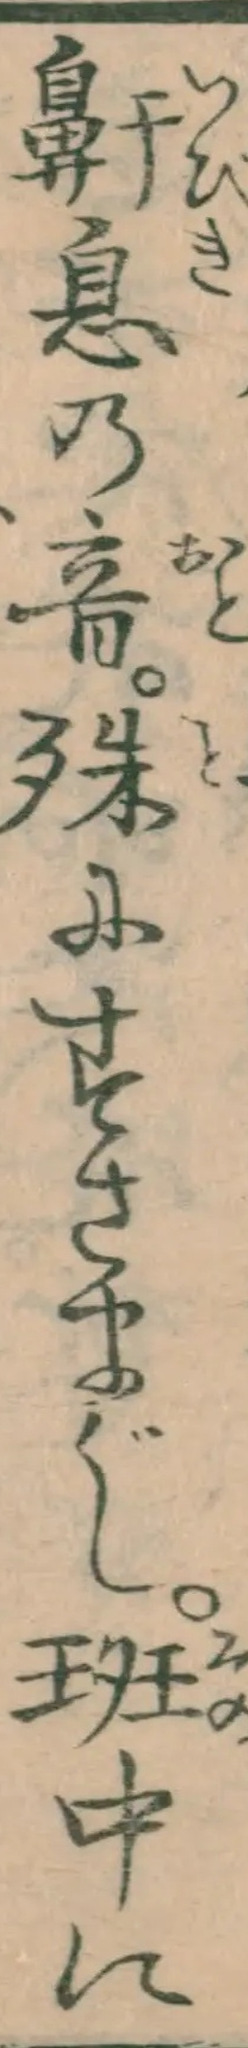鼾息の音。殊にすさまじ。班中に
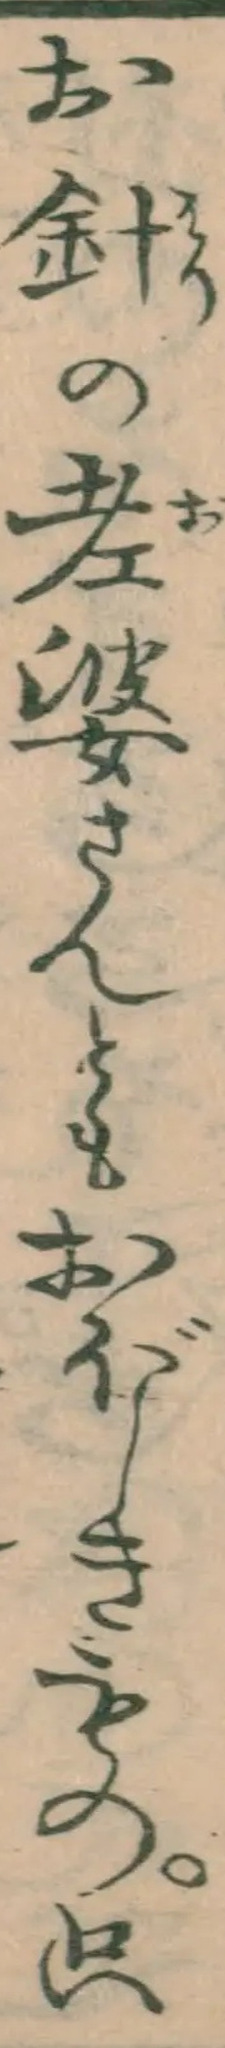お針の老婆さんともおぼしきもの。只
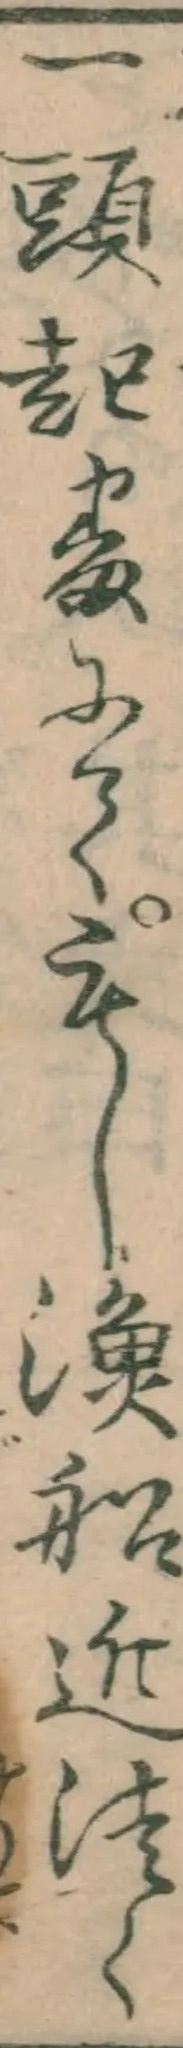一頭起番にて。もし漁船近つく
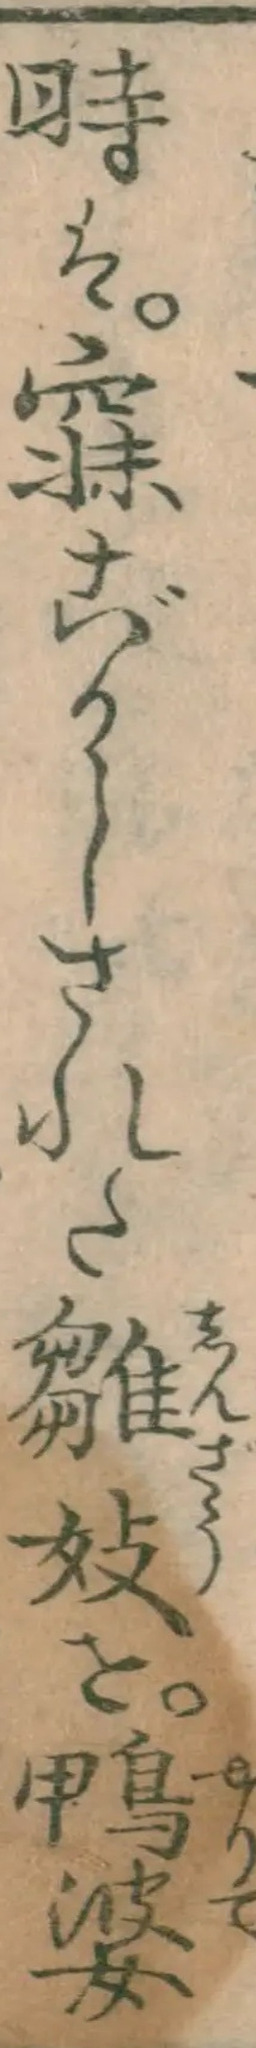時は。寝ごかしされた雛妓を。鴨婆
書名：麻疹戯言
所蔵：国立国会図書館 National Diet Library, JAPAN
